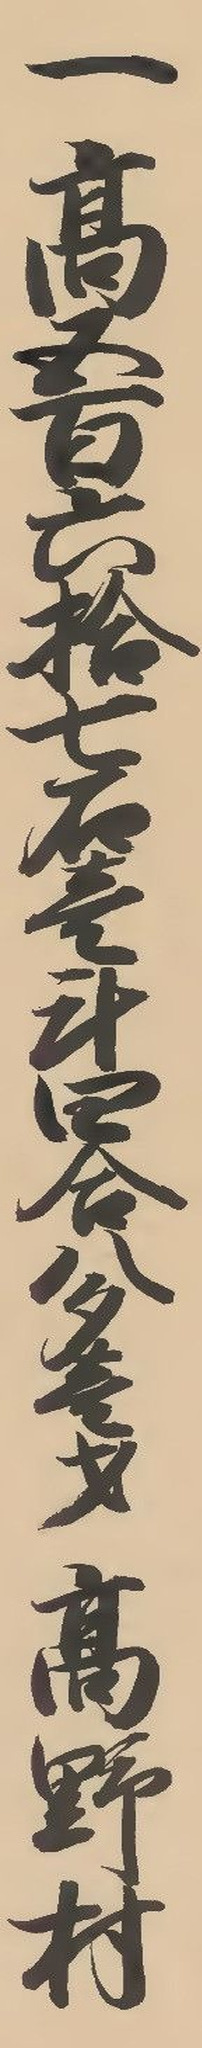一高五百六拾七石壱斗四合八勺壱才高野村
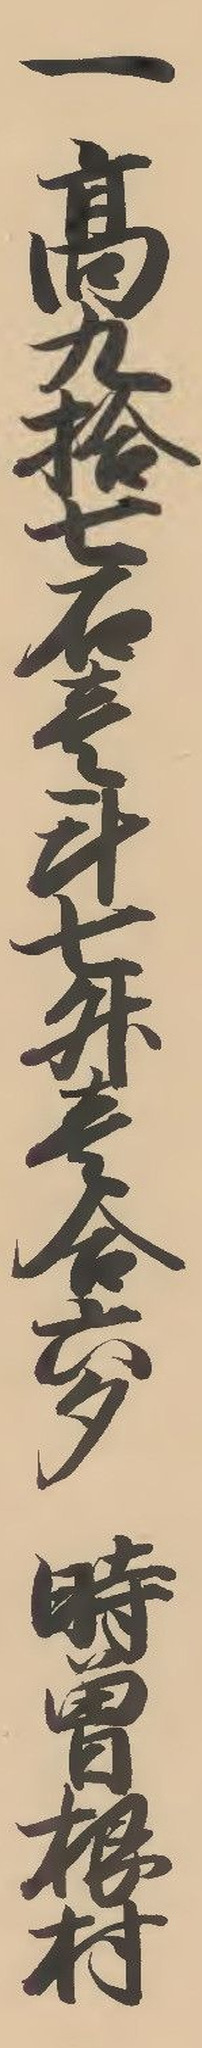一高九拾七石壱斗七升壱合六勺時曽根村

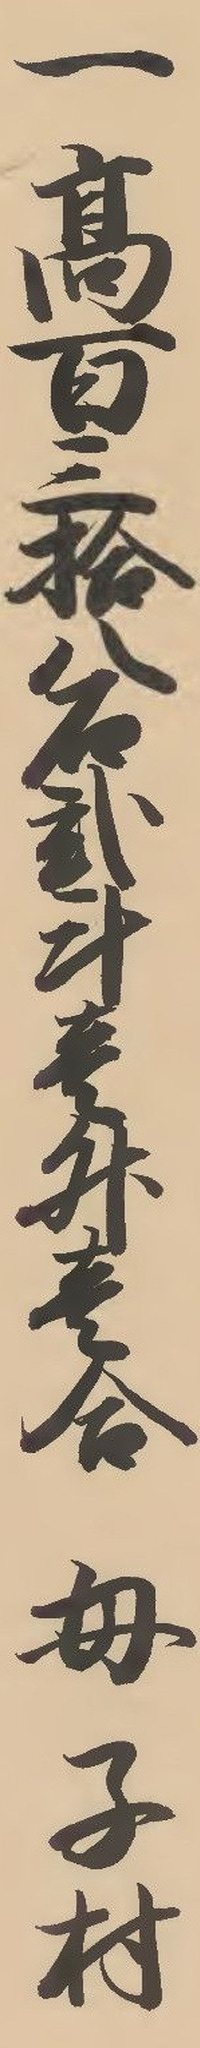一高百三拾八石弐斗壱升壱合母子村
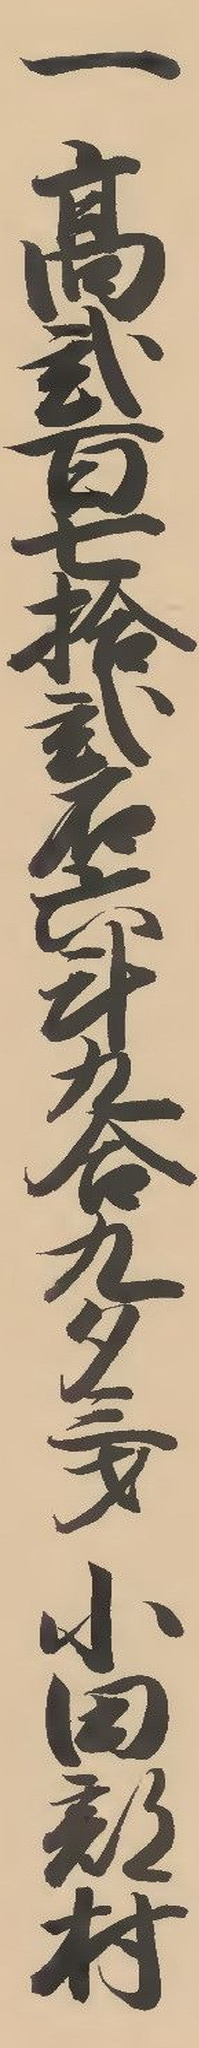一高弐百七拾弐石六斗九合九勺三才小田部村
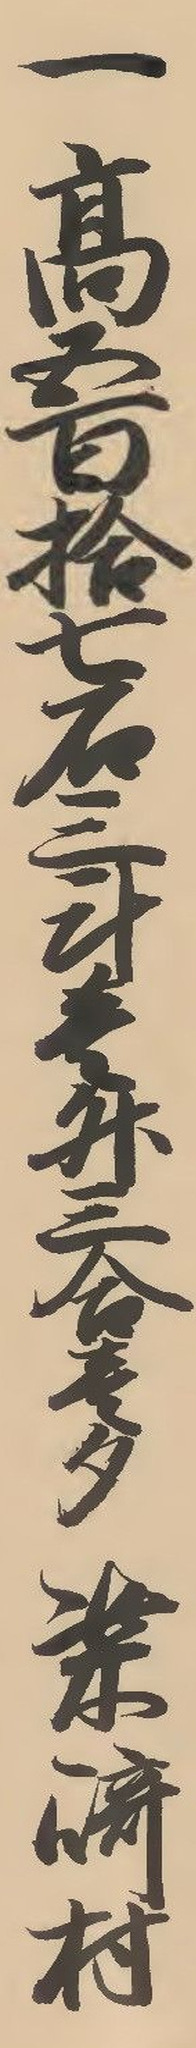一高五百拾七石三斗壱升三合壱勺桑崎村
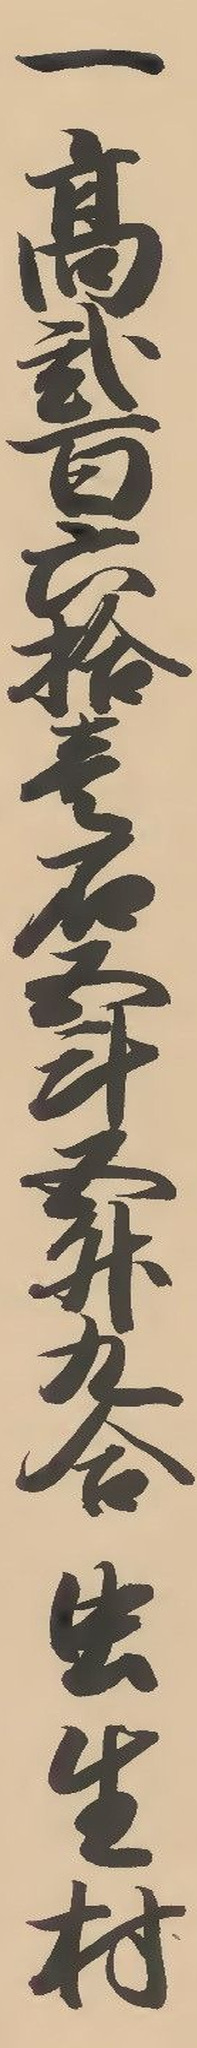一高弐百六拾壱石五斗五升九合虫生村
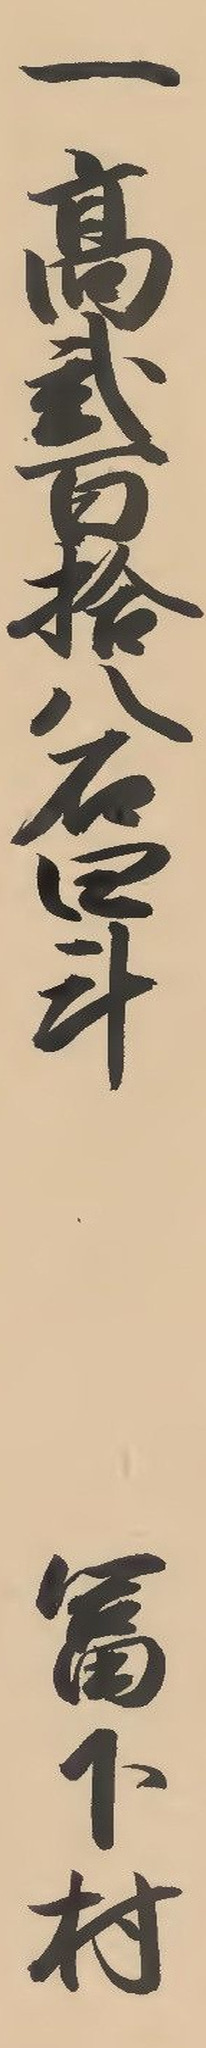一高弐百拾八石四斗富下村
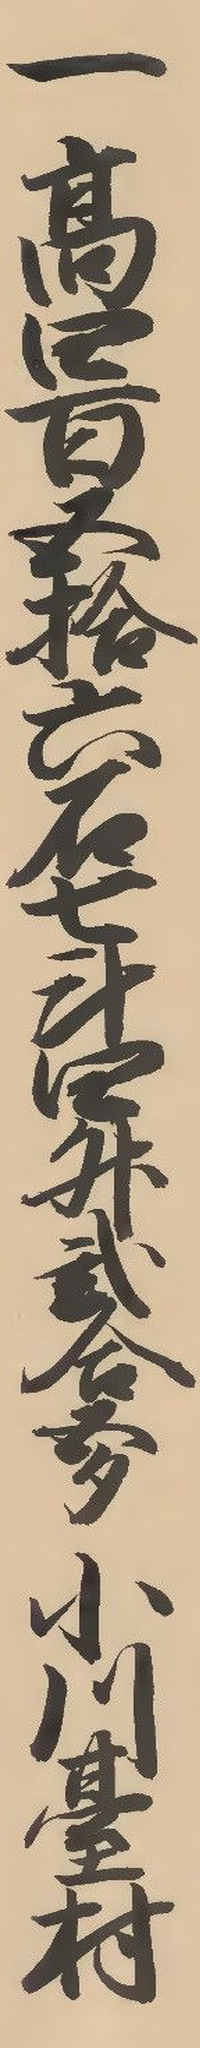一高四百五拾六石七斗四升弐合五勺小川台村
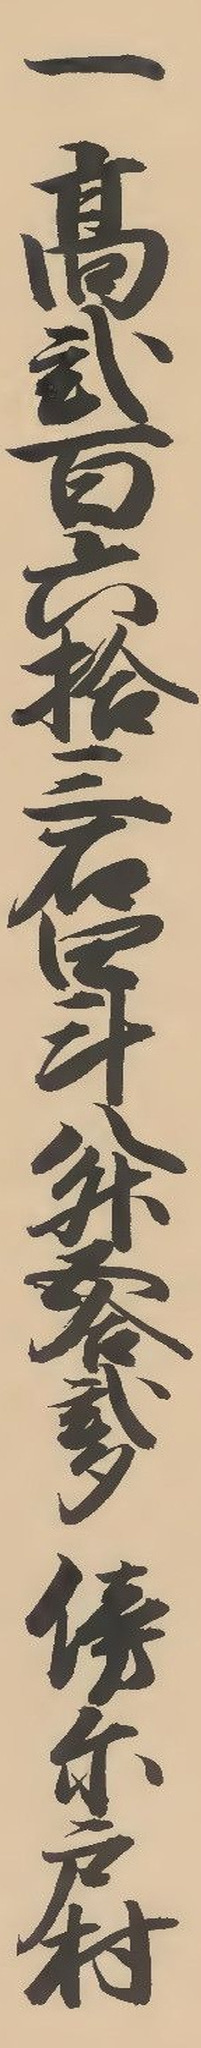一高弐百六拾三石四斗八升五合弐勺傍示戸村
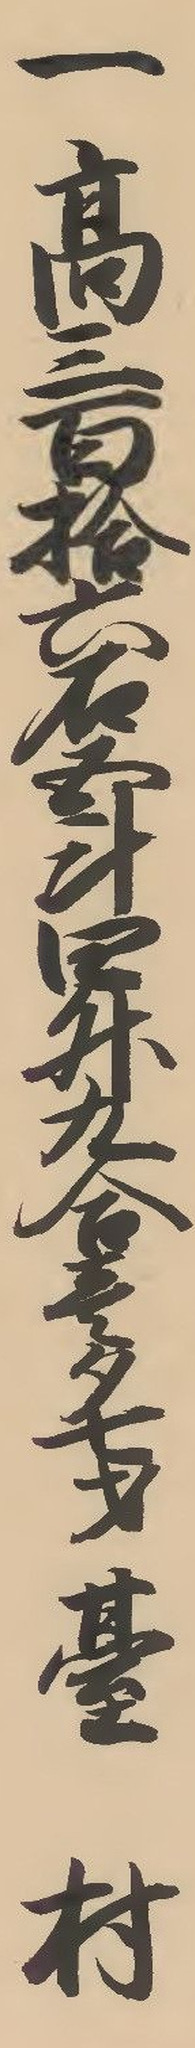一高三百拾六石五斗四升九合壱勺七才台村

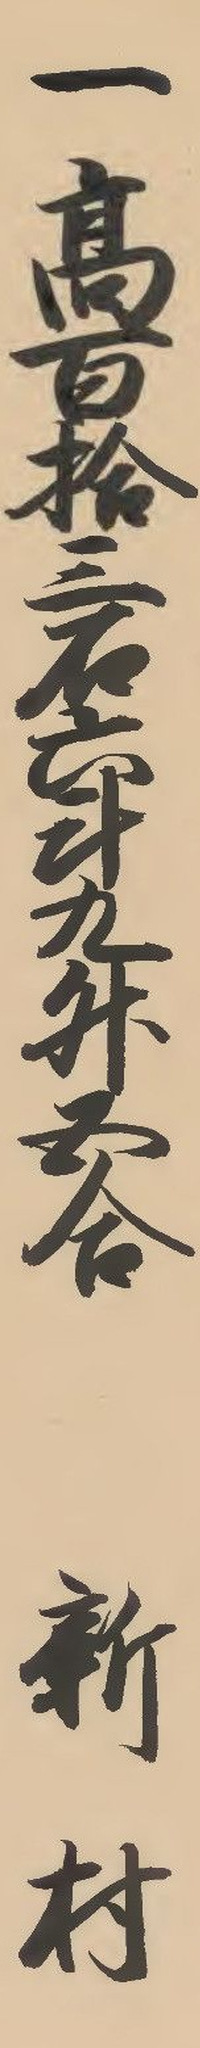一高百拾三石六斗九升五合新村
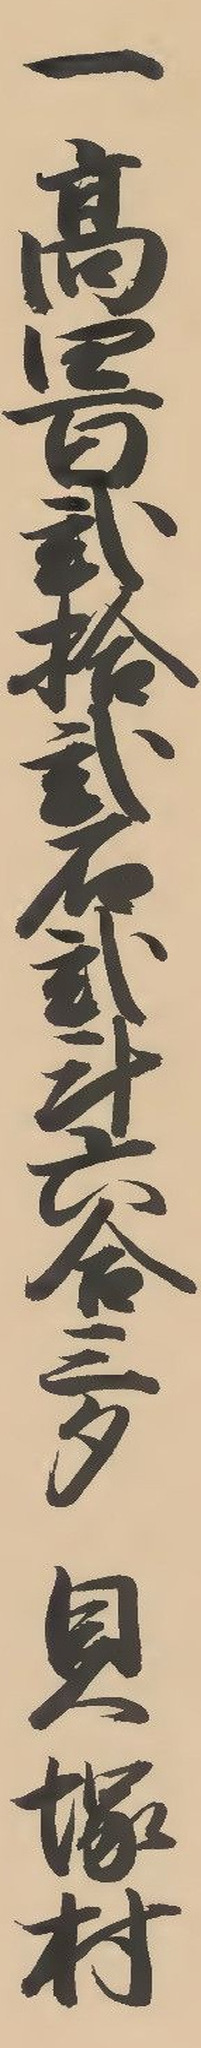一高四百弐拾弐石弐斗六合三勺貝塚村
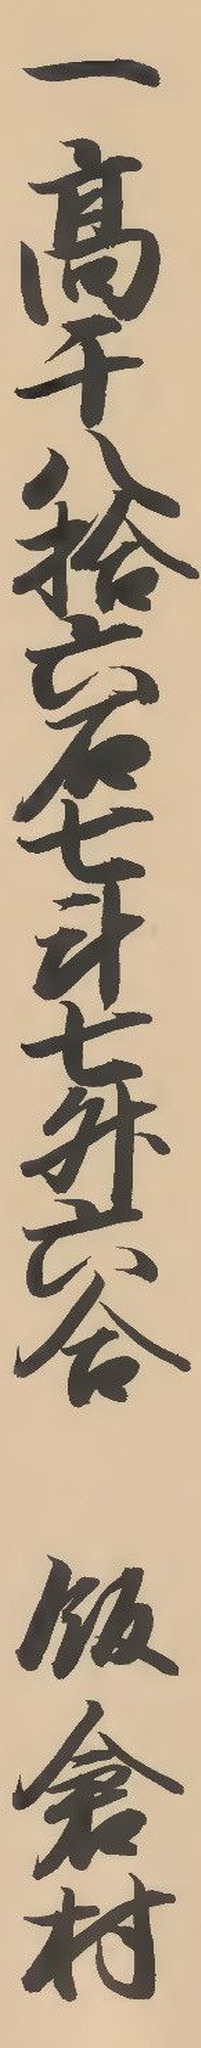一高千八拾六石七斗七升六合飯倉村
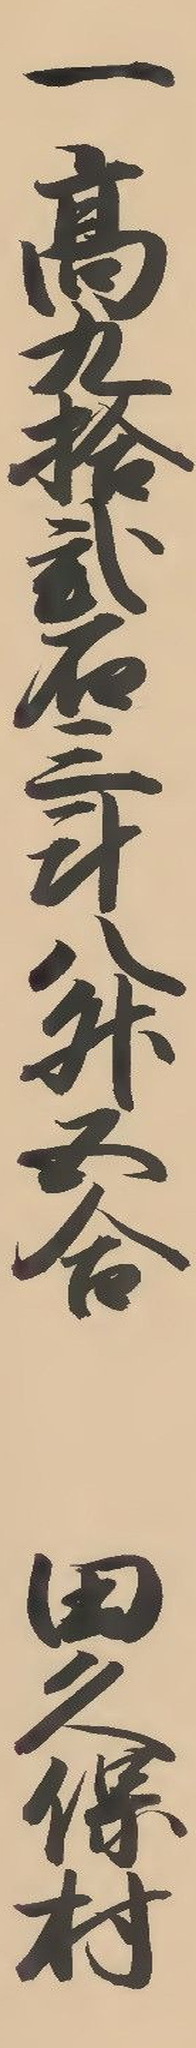一高九拾弐石三斗八升五合田久保村
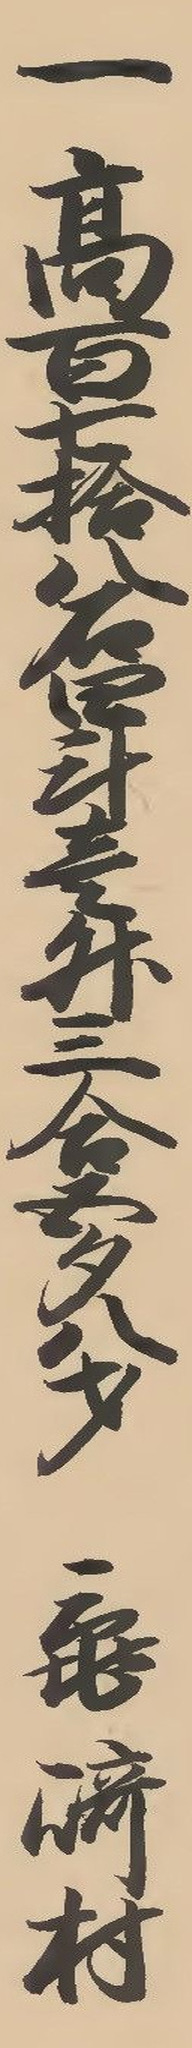一高百七拾八石四斗壱升三合五勺八才亀崎村
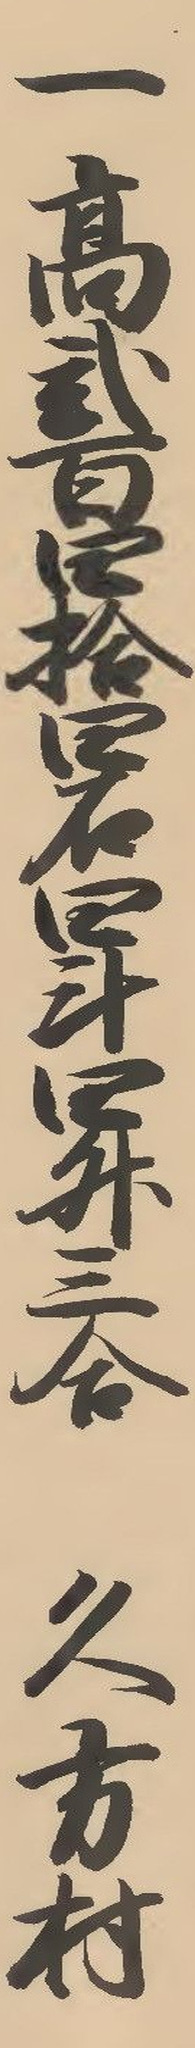一高弐百四拾四石四斗四升三合久方村
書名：下総国郷帳
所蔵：国立公文書館 National Archives of Japan
